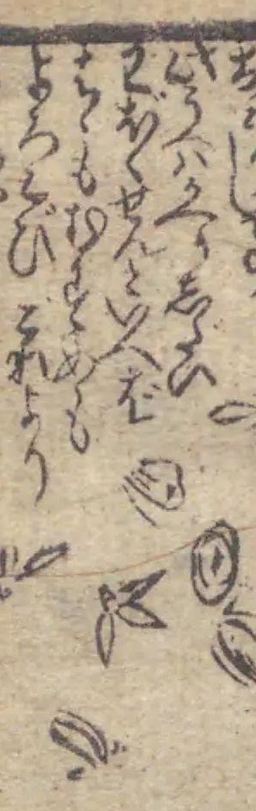わぼくせんといへば
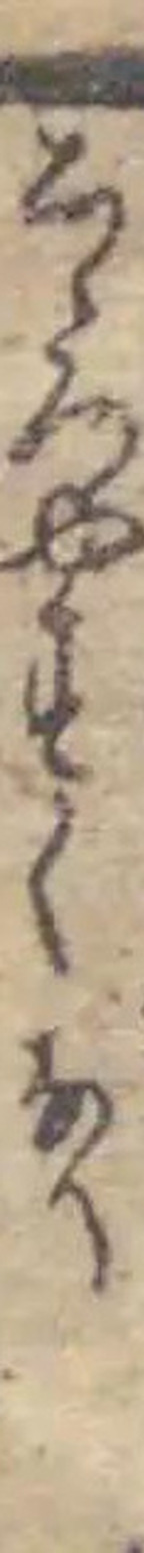こゝろやすくなり
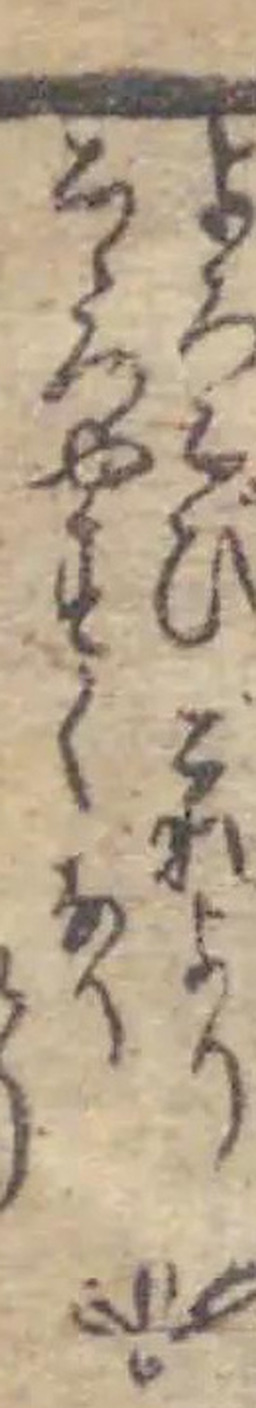こゝろやすくなり
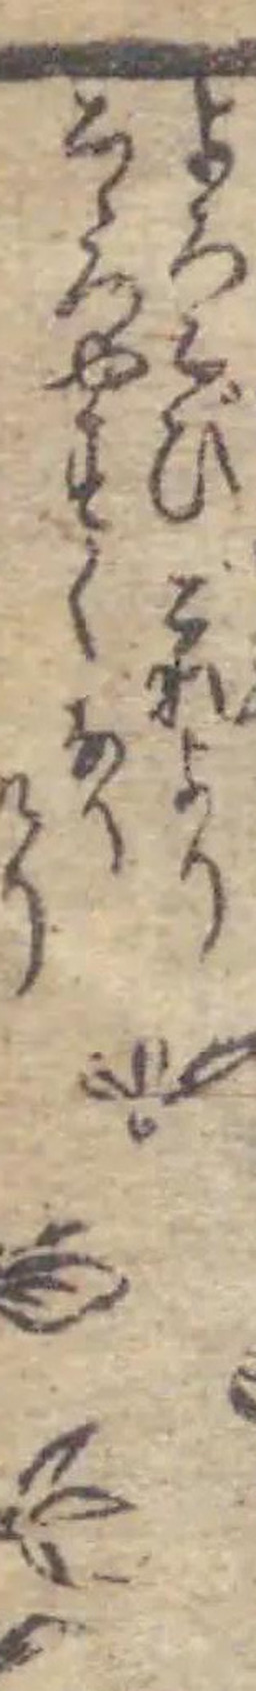こゝろやすくなり

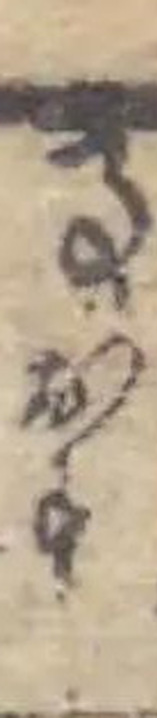事おす
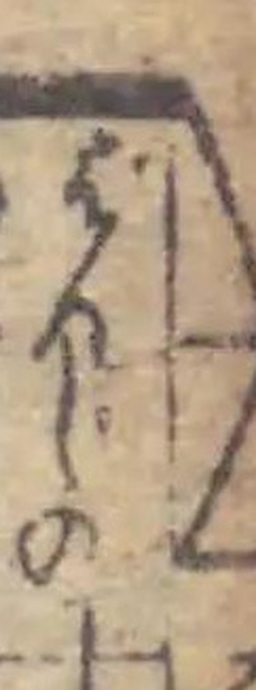ばんじの
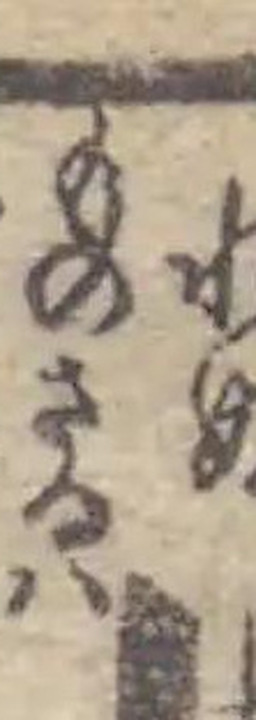ものさるは
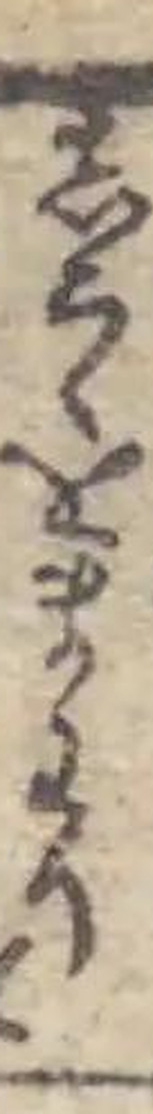しこくをまわりて
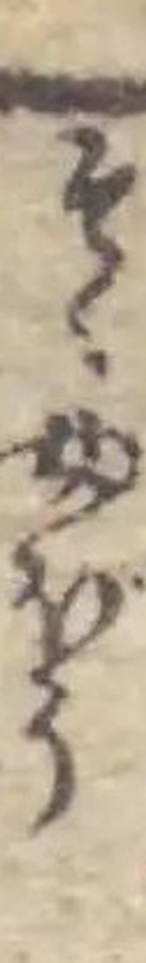そく女ぼう
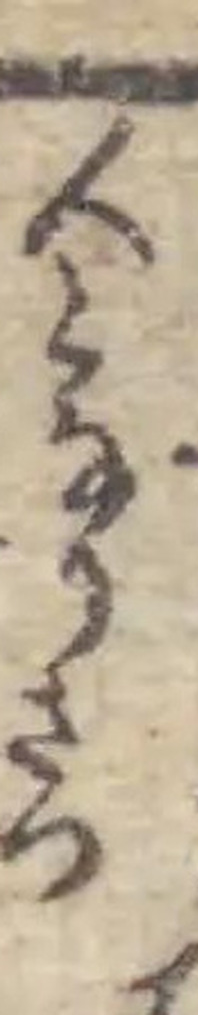人となりさつ
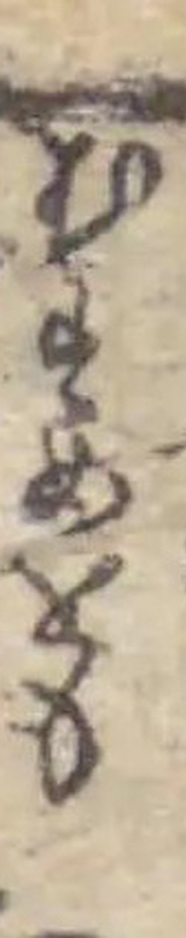むすめをも
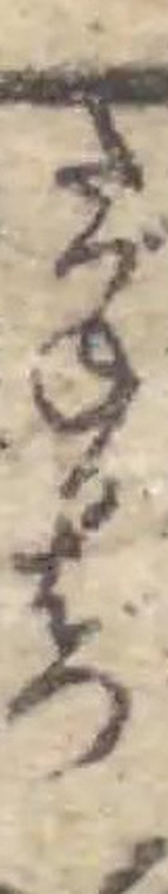たづねるはつ
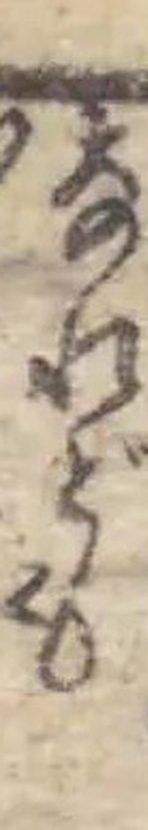なれども
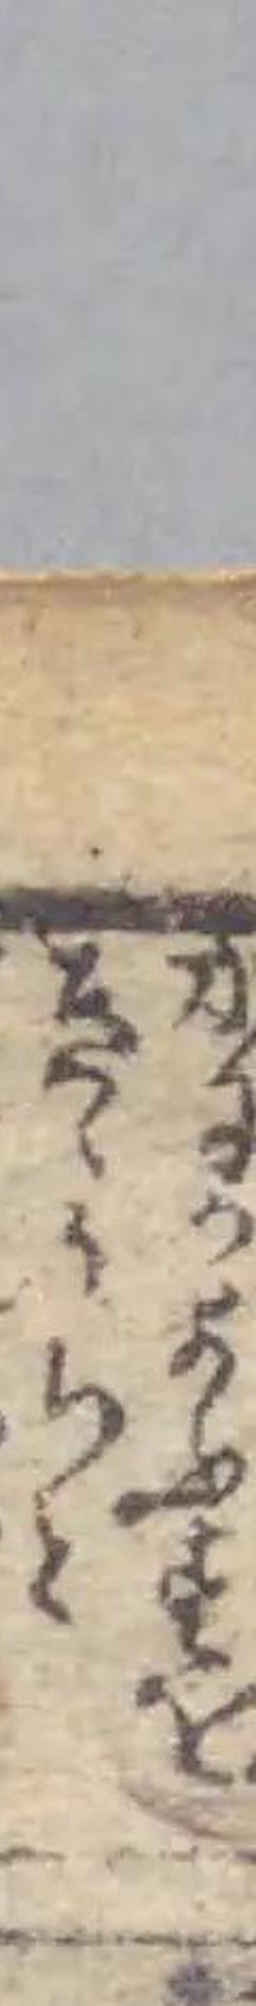きくかちと
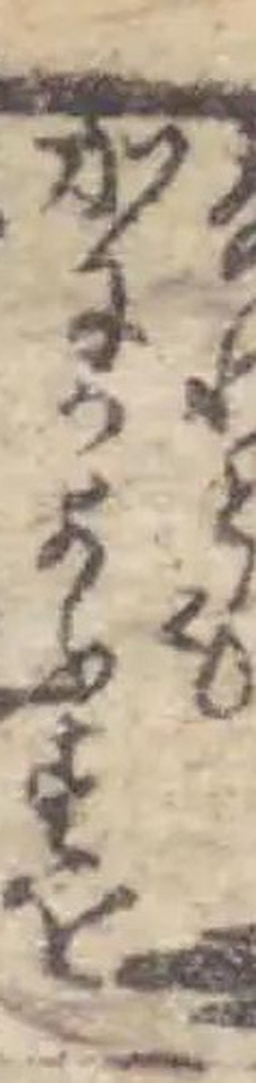かにかよふすを
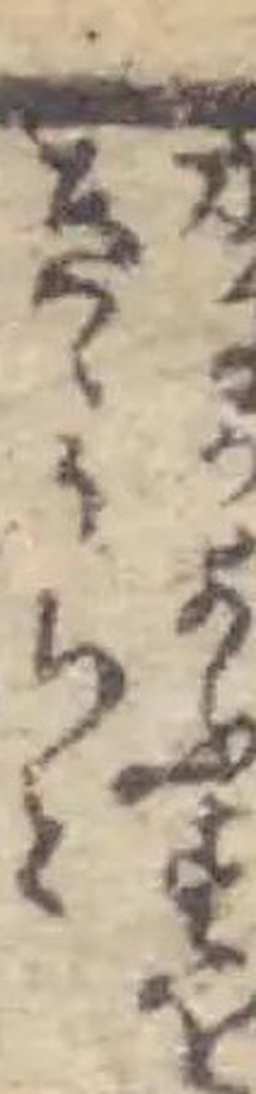きくかちと
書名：蟹牛房挟多 3巻
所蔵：国立国会図書館 National Diet Library, JAPAN
